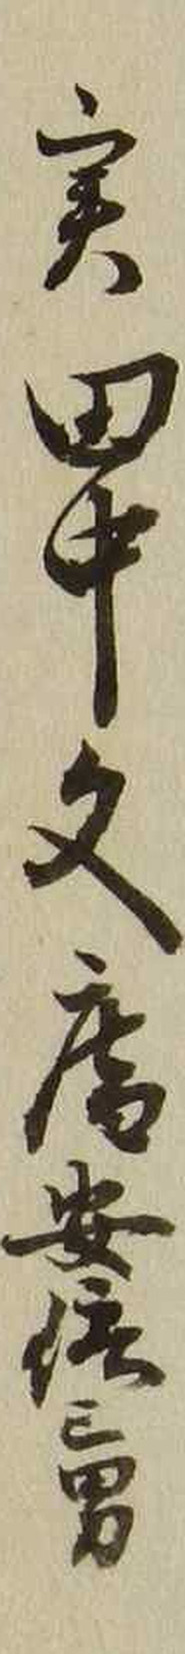実田中久広安信三男
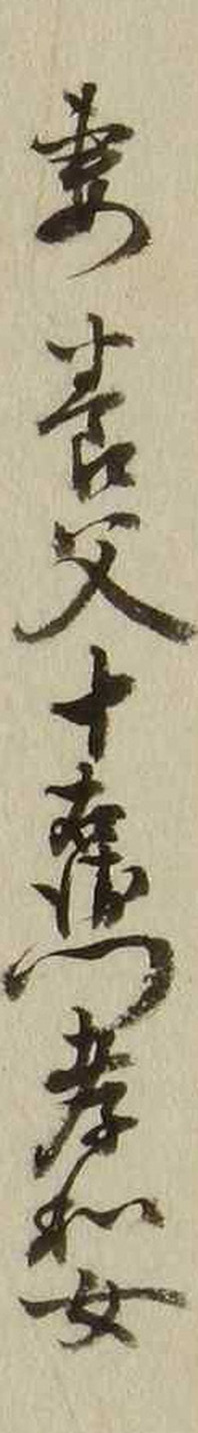妻養父十右衛門孝和女
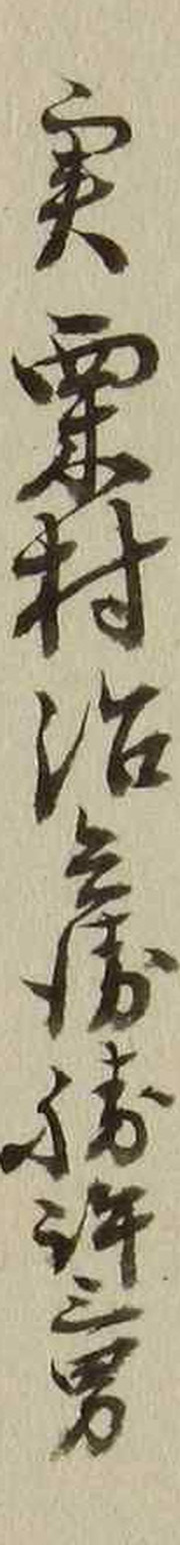実栗村治兵衛勝許三男
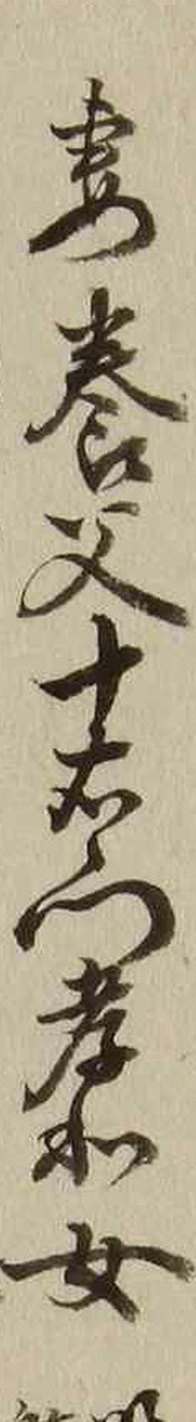妻養父十右衛門孝和女
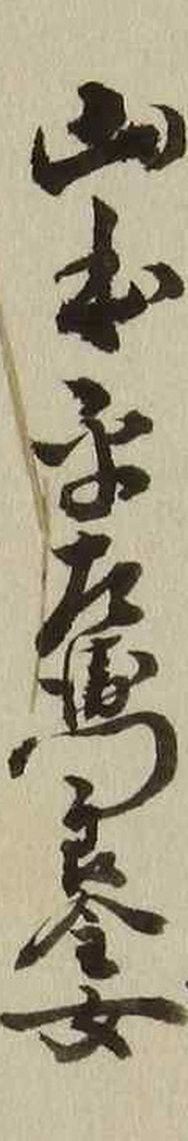山本平左衛門養女
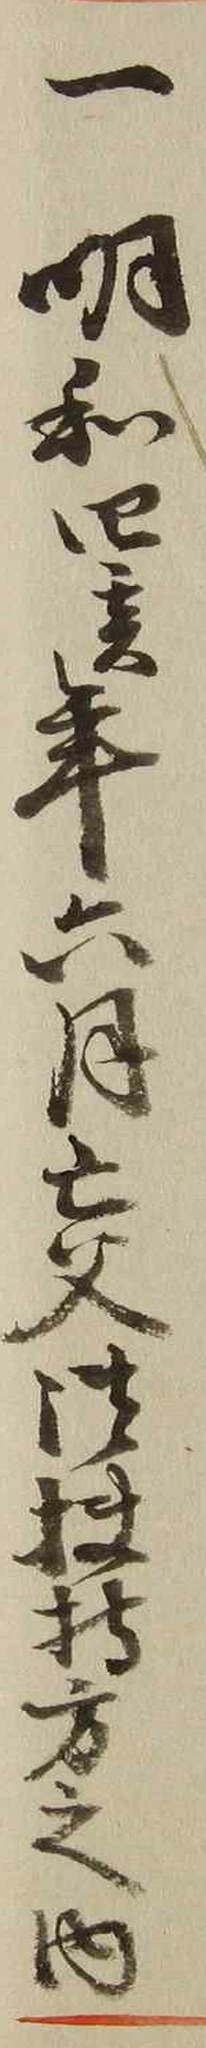一明和四亥年六月亡父御扶持方之内
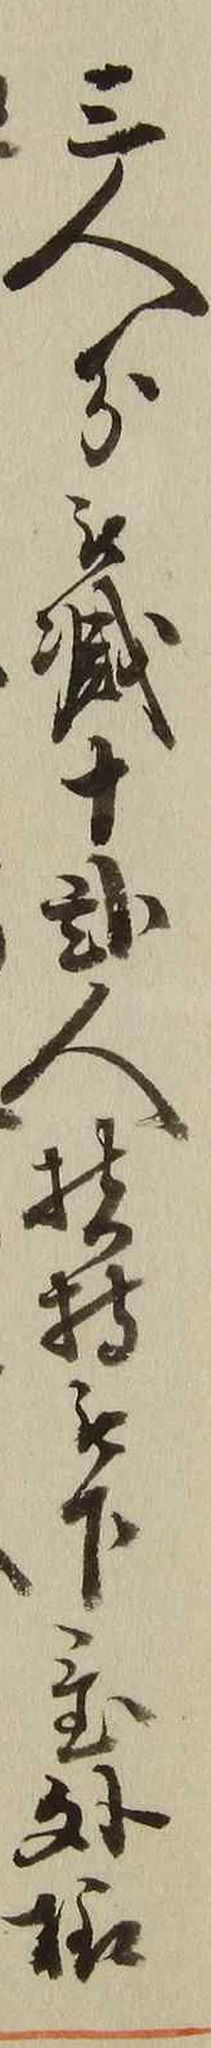三人分被減十弐人扶持被下置外様
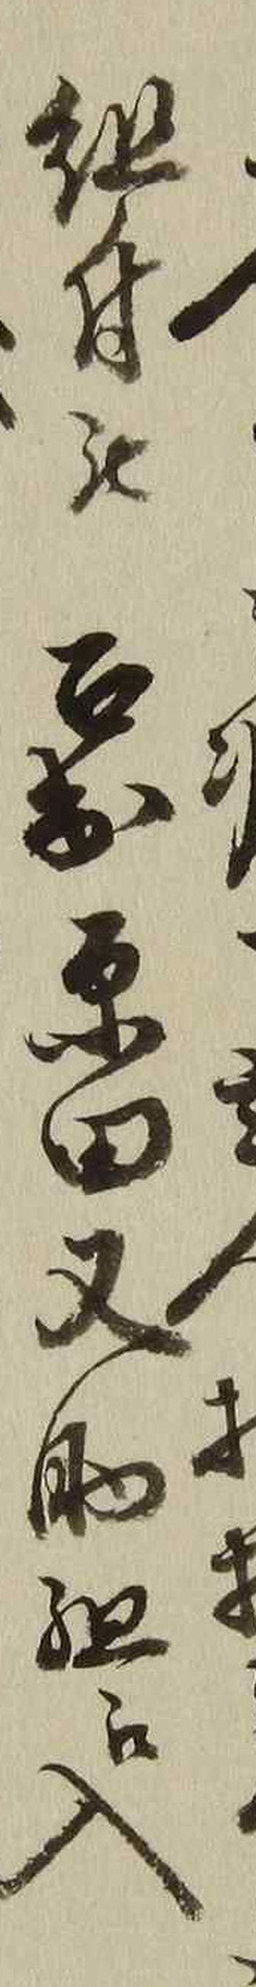組付被召出原田又助組江入
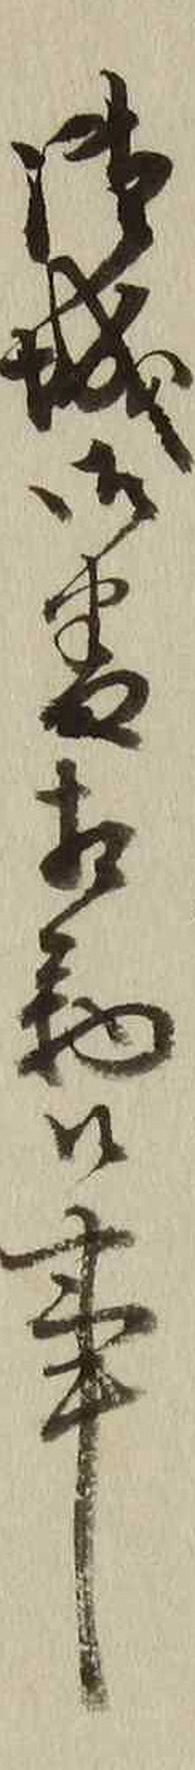御城御番相勤候事
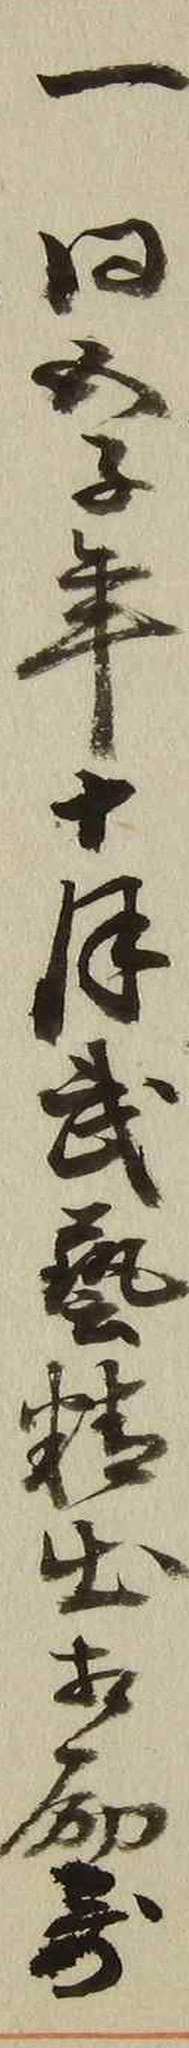一同五子年十月武芸精出相励奇
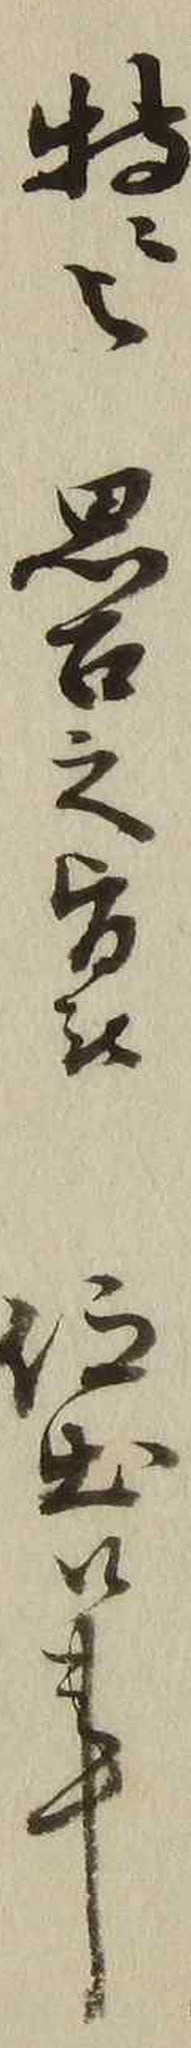特ニ被思召之旨被仰出候事
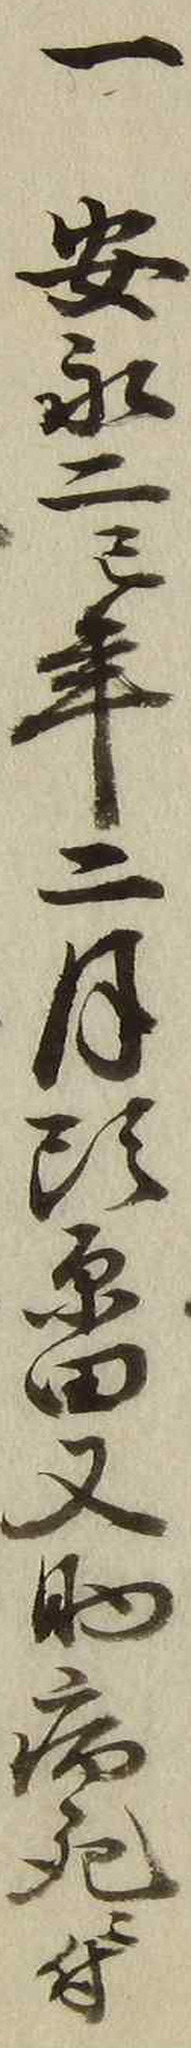一安永二巳年二月頃原田又助病死ニ付
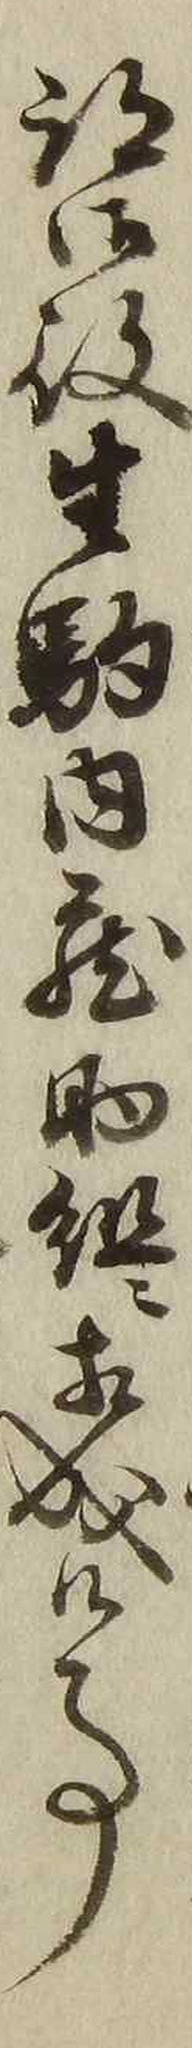跡御役生駒内蔵助組ニ相也候事
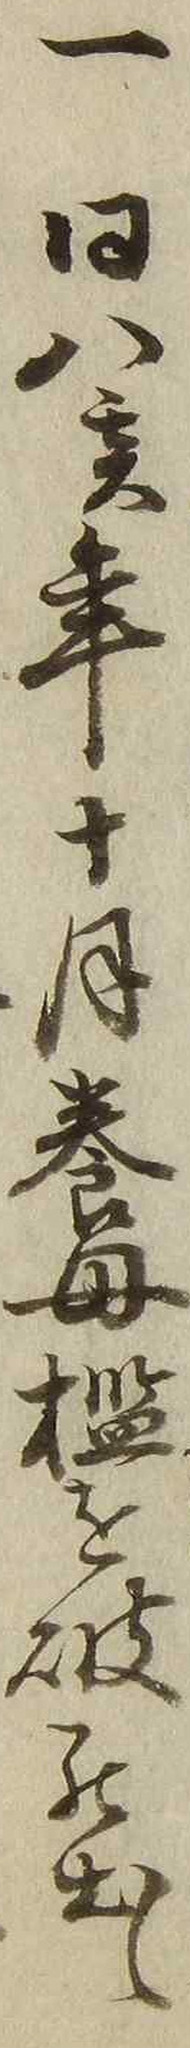一同八亥十月養母檻を破罷出候
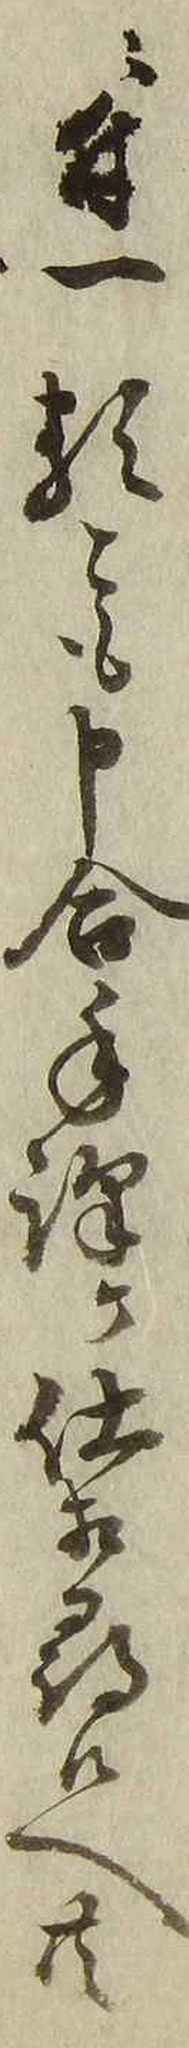ニ付一類とも申合手訳ケ仕相尋候得共
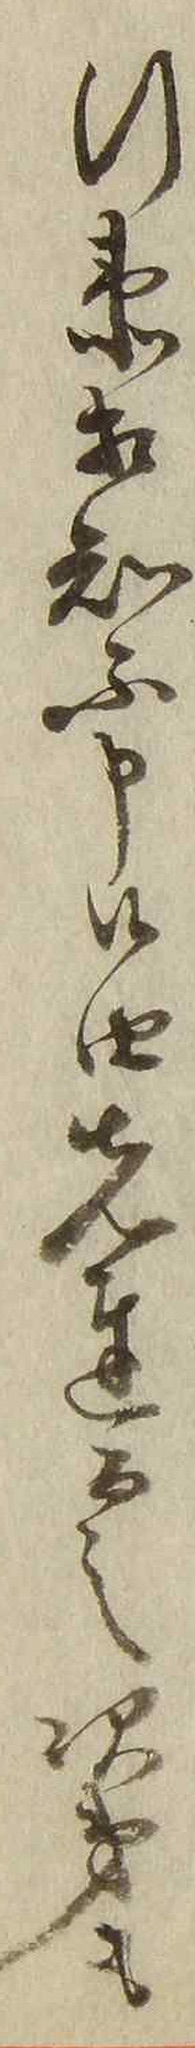行衛相知不申候由先達而之次第も
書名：諸士系譜　巻之31　い之部31
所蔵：会津若松市立会津図書館
